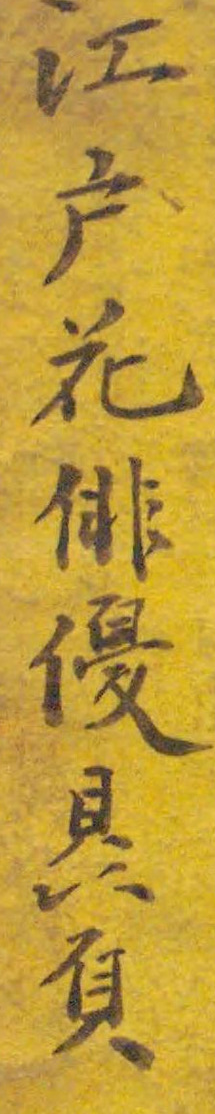江戸花俳優贔屓

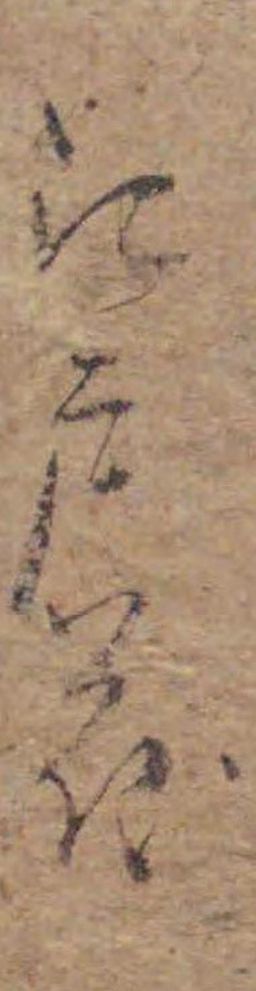江戸花

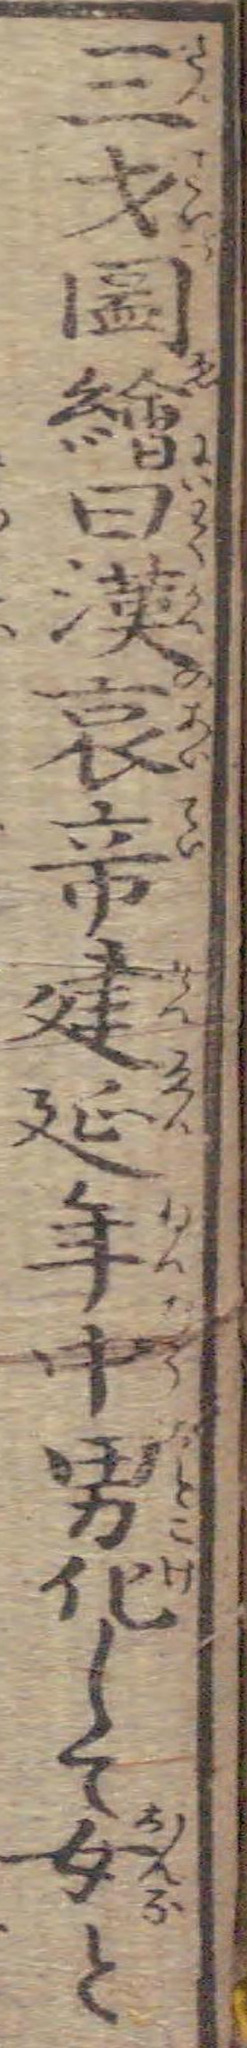三才図絵曰漢哀帝建延年中男化して女と
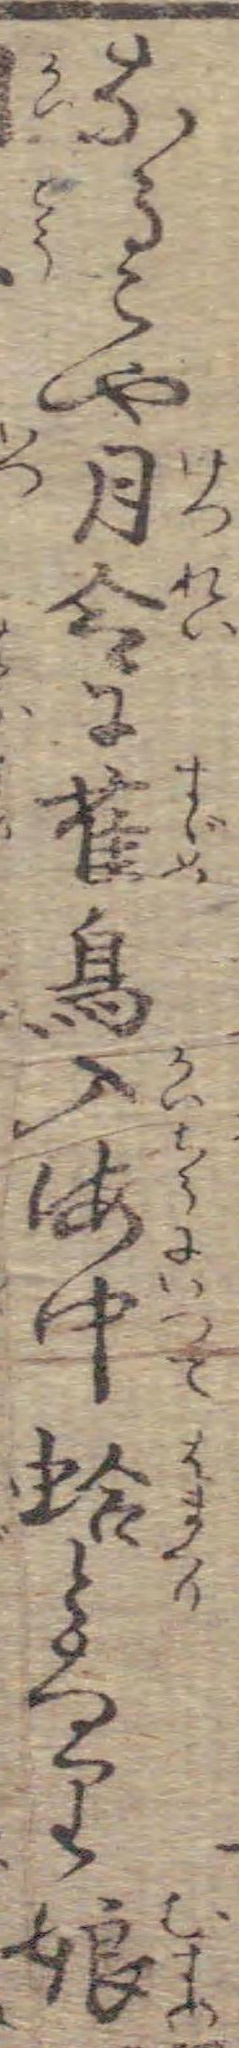なるこや月令に雀鳥入海中蛤となり娘
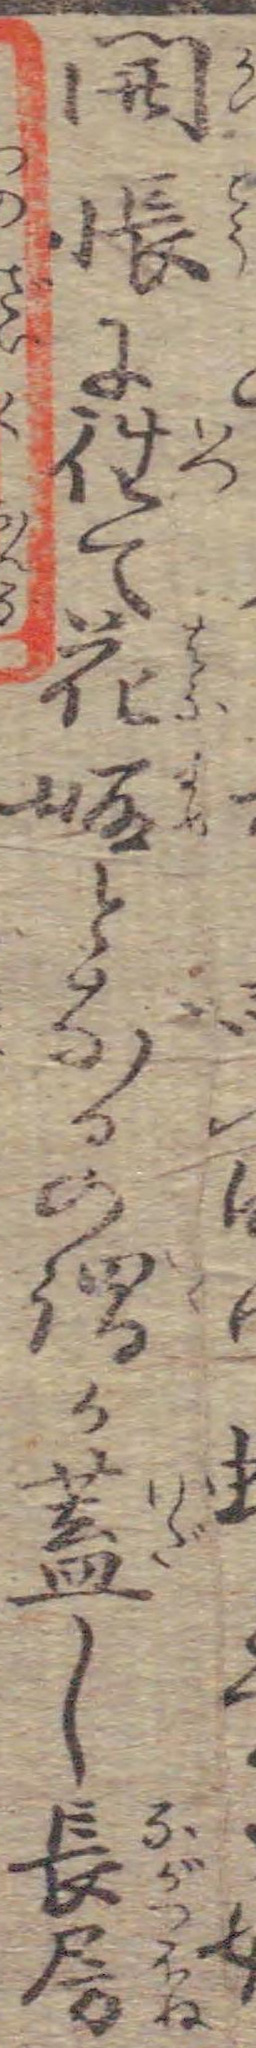開帳に往て花娵となるの謂か蓋し長房
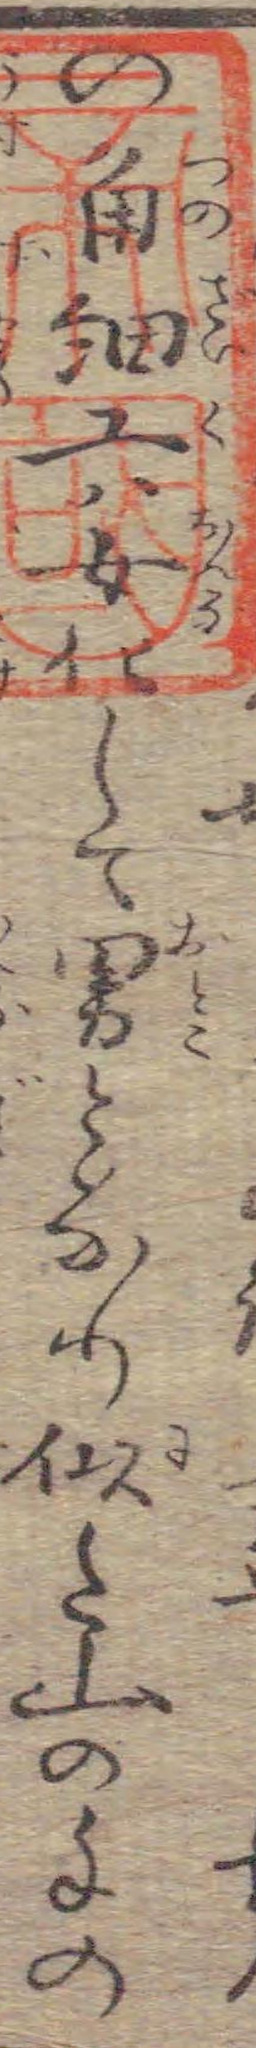の角細工は女化して男となり似た山の手の
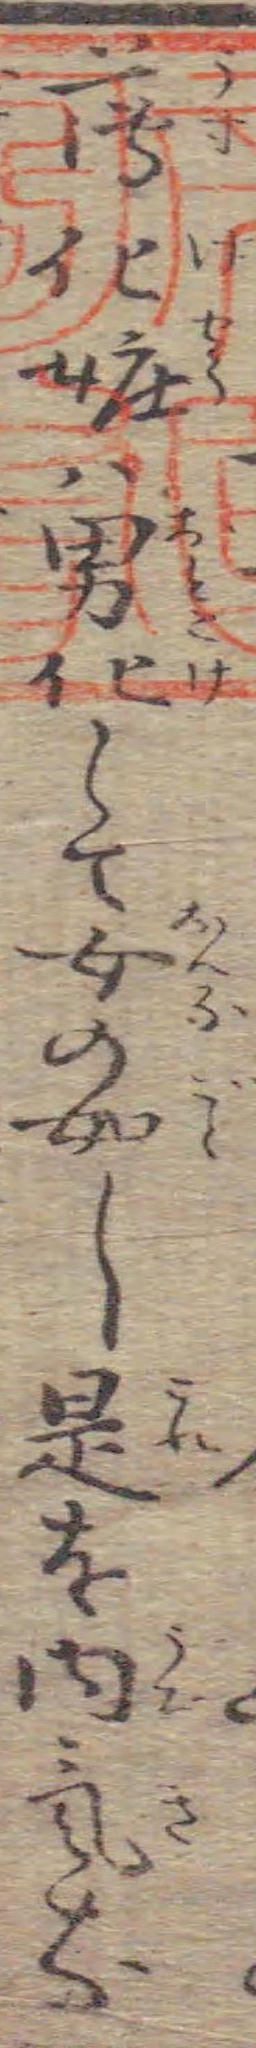薄化粧は男化して女の如し是を内気な
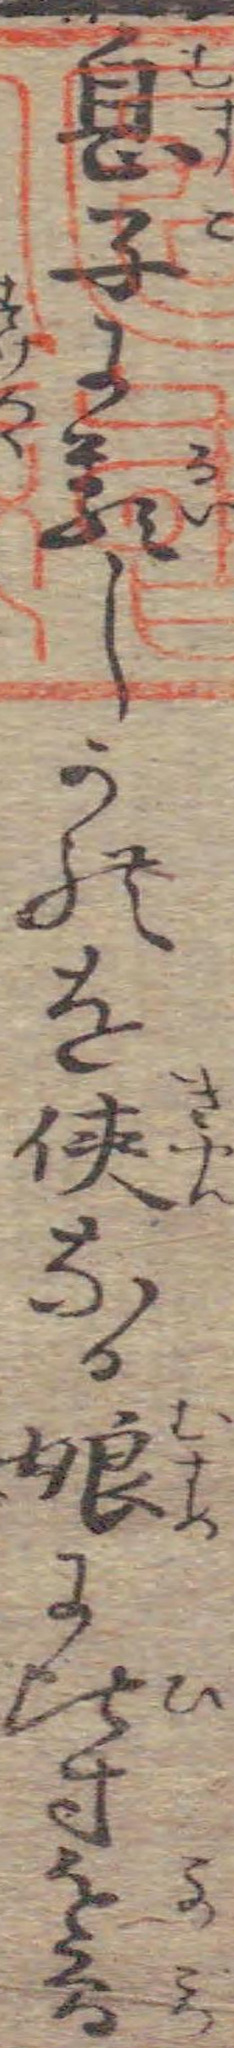息子に類しかのを侠なる娘に比すを近曽
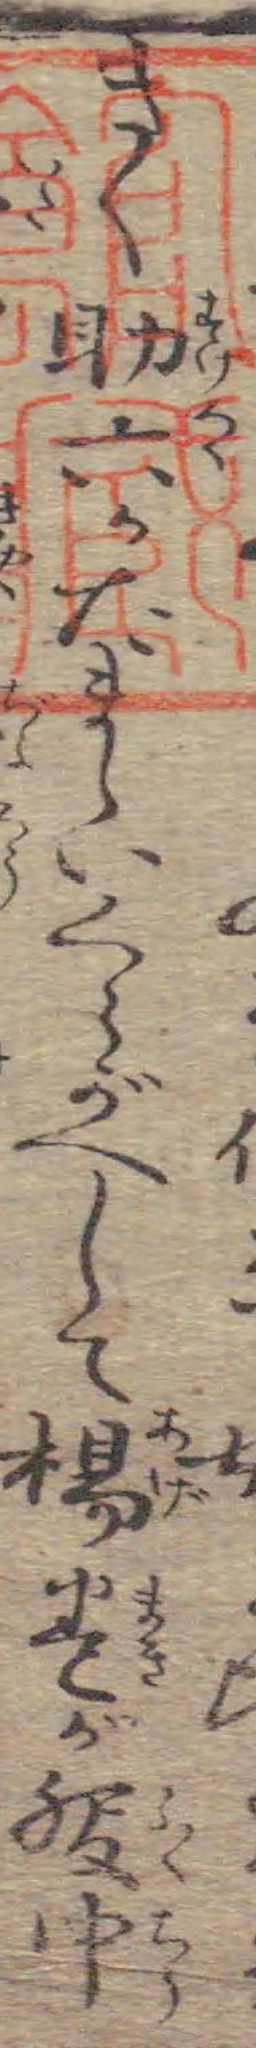きく助六かたましいくらがへして楊巻が腹中
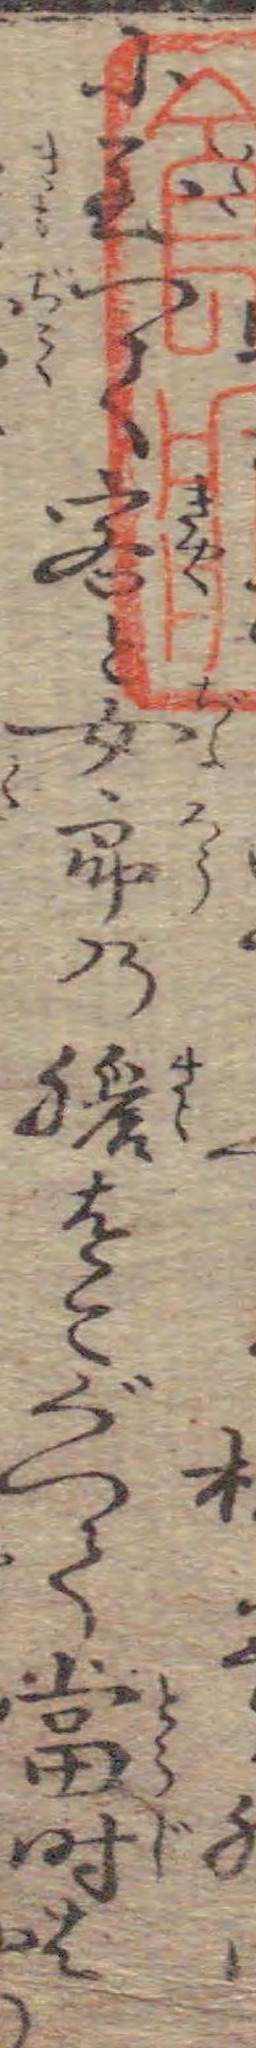に至つて客と女郎の胆をこぐつて当時はやり
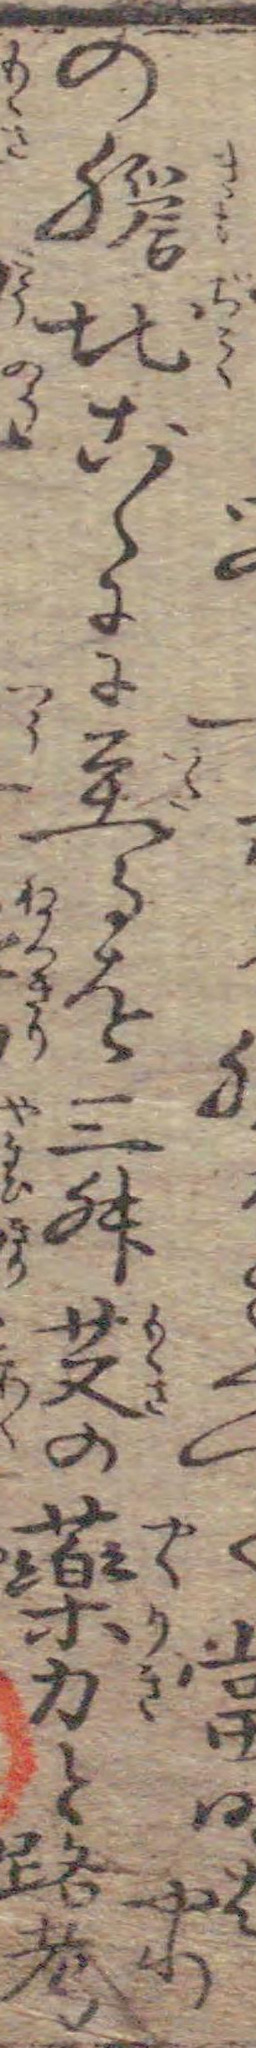の胆地こゝにに至るを三升艾の薬力と路考
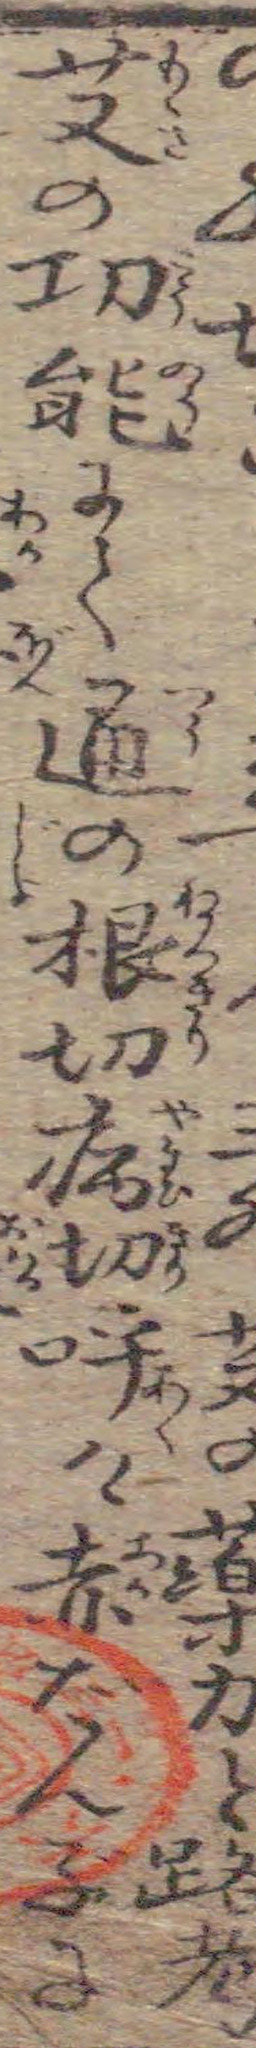艾の㓛能にて通の根切病切呼々赤だん子に
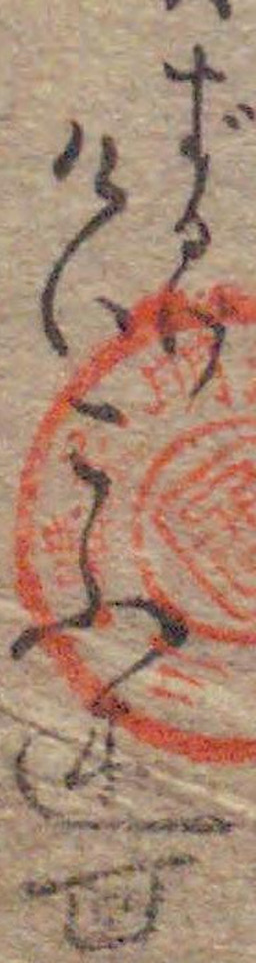けいこふれ

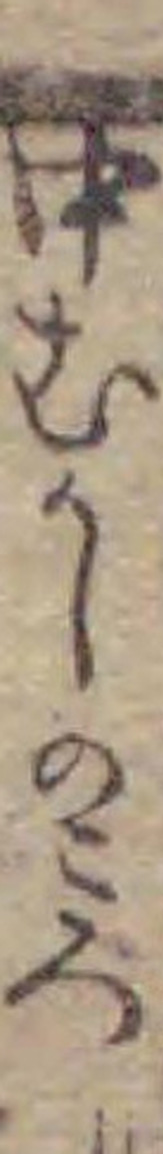中むかしのころ
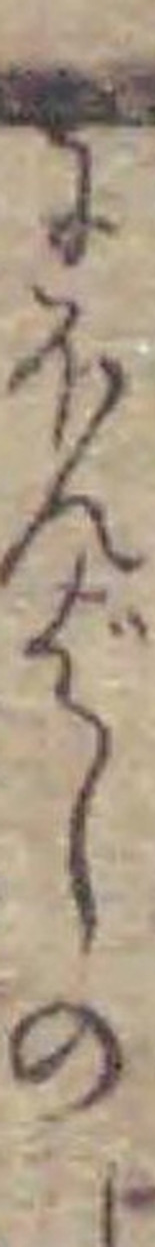にほんばしの
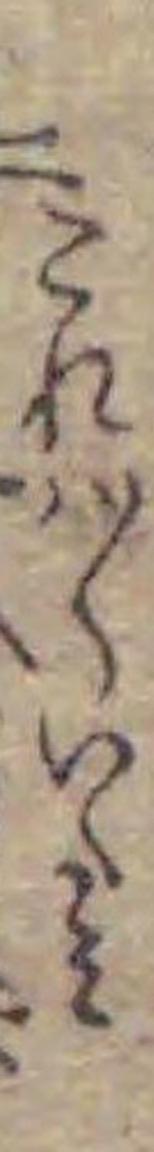これは〳〵いたみ
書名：江戸花俳優贔屓 : 3巻
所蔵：国立国会図書館 National Diet Library, JAPAN
